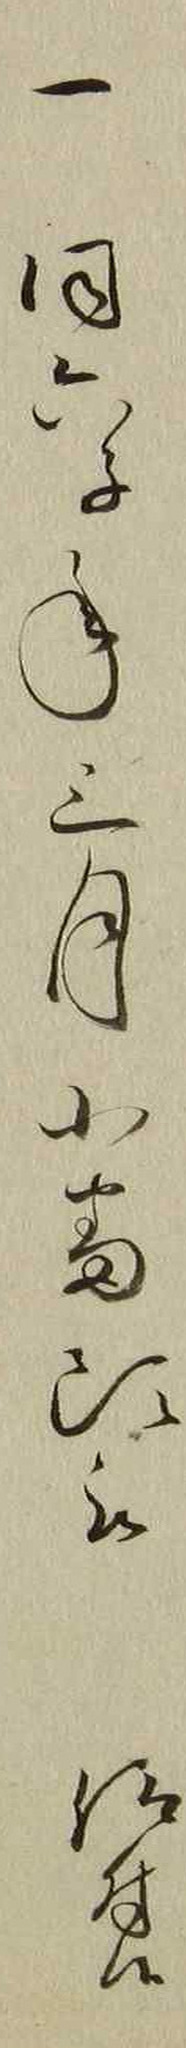一同六子年三月小番頭被仰付候
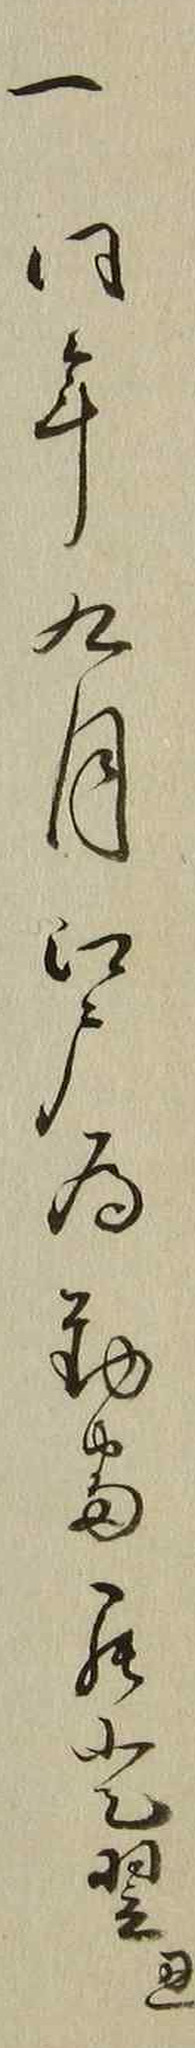一同年九月江戸為勤番罷登翌丑
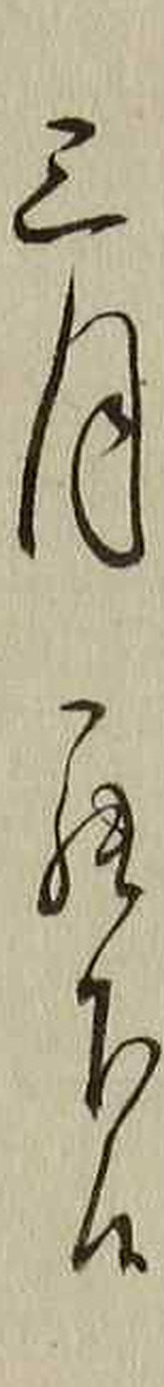三月罷下候
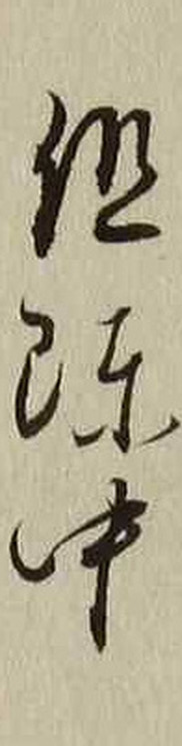但陣中
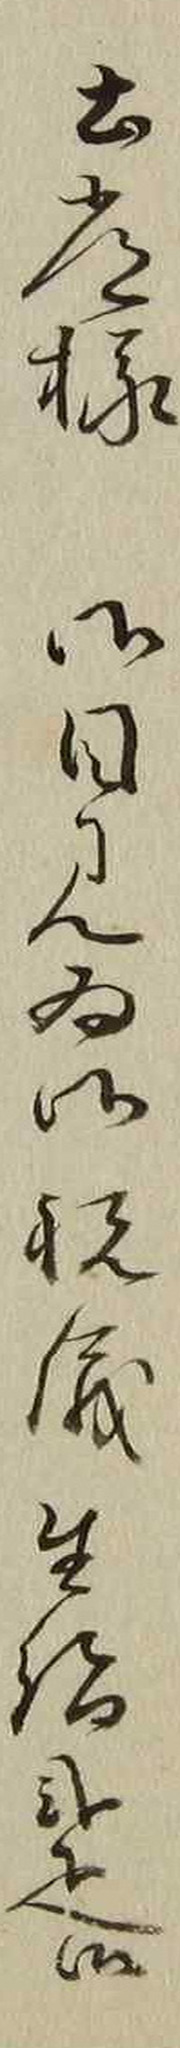土常様御目見為御祝儀生絹弐疋御
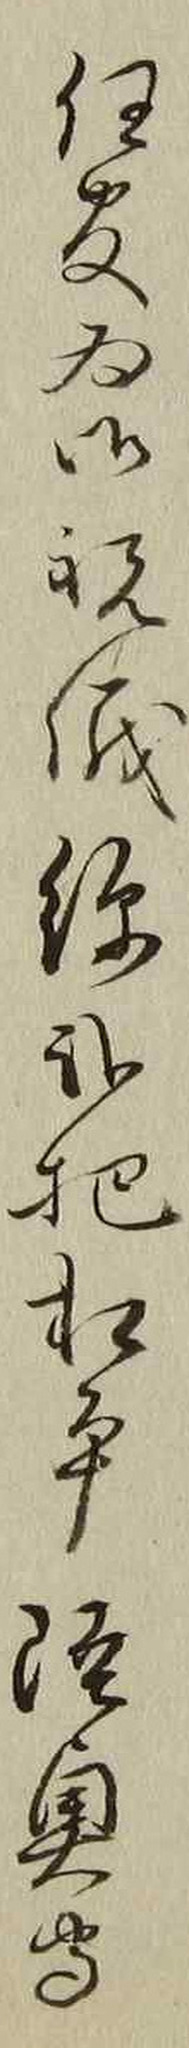任官為御祝儀綿弐把松平陸奥守
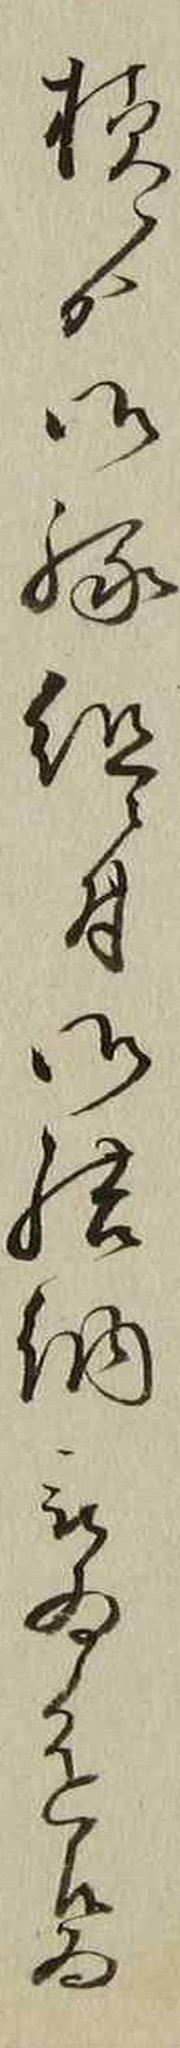様ゟ御縁組ニ付御結納被為遊候為
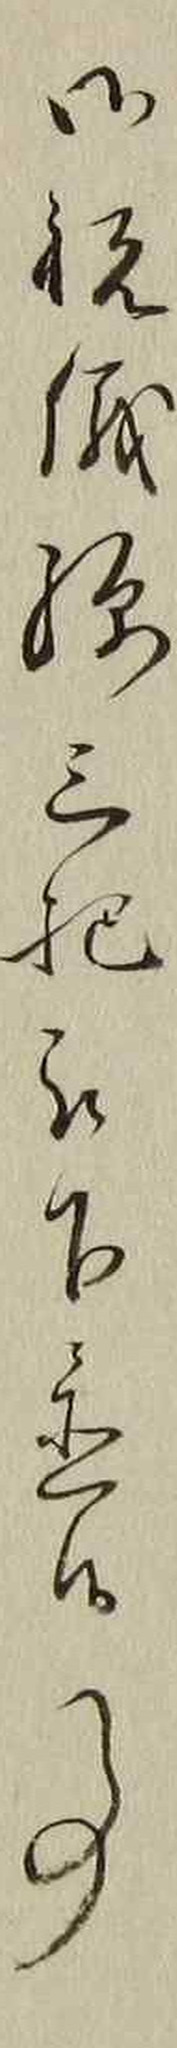御祝儀綿三把被下置候事
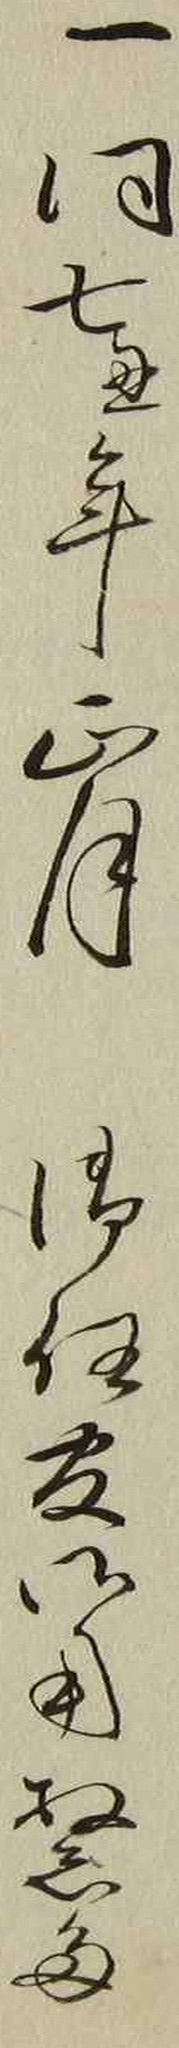一同七丑年正月御任官御用繁多
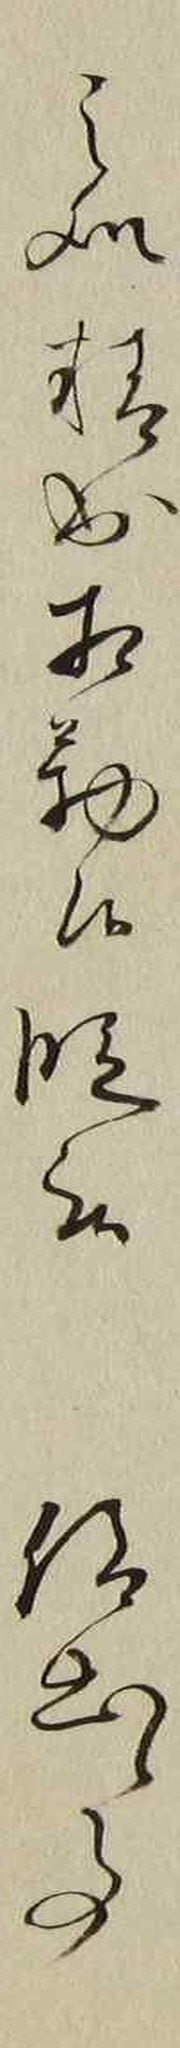之処精出相勤候段被仰出候事
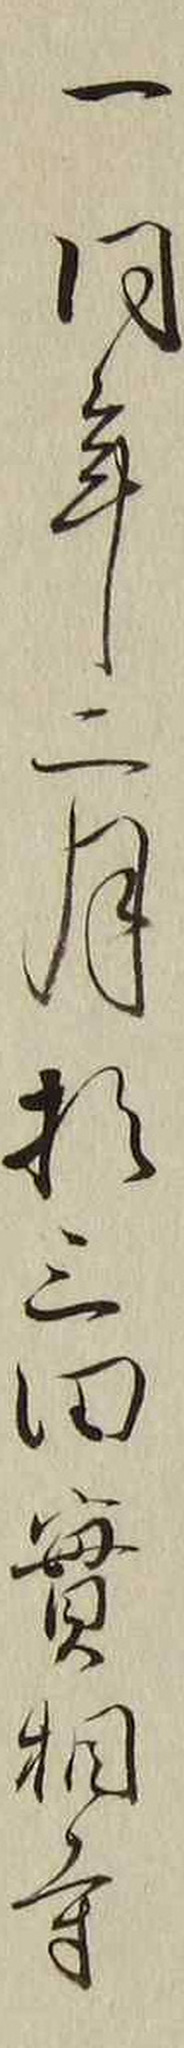一同年二月於三田実相寺
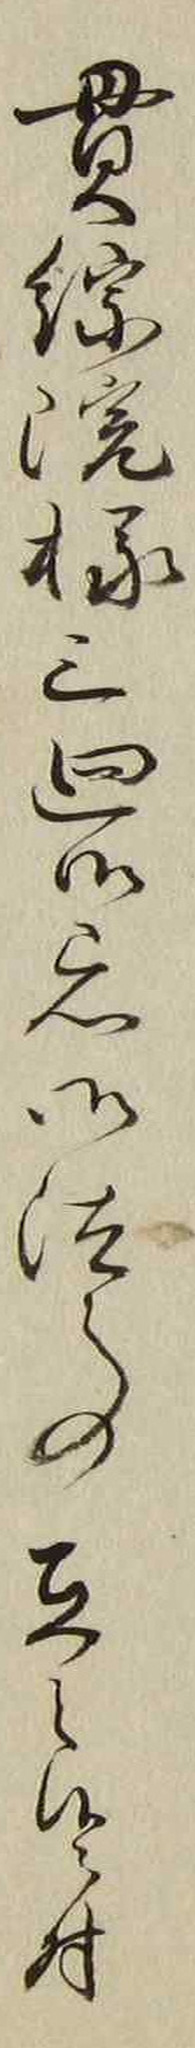貫綜院様三廻御忌御法事在之候ニ付
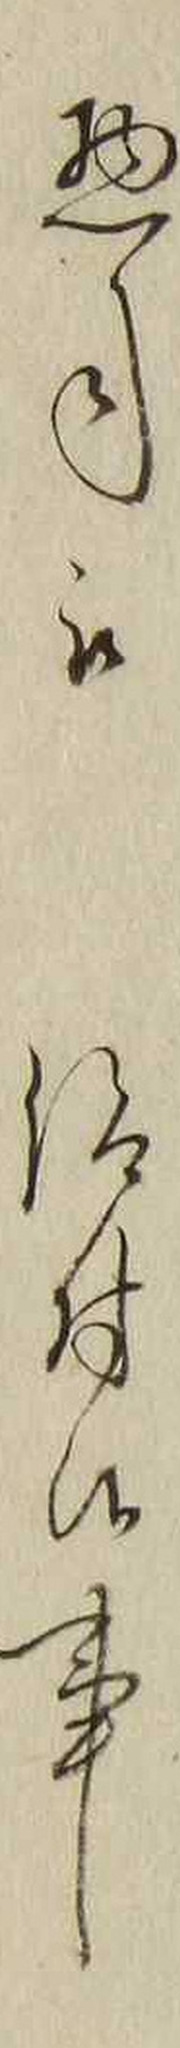惣司被仰付候事

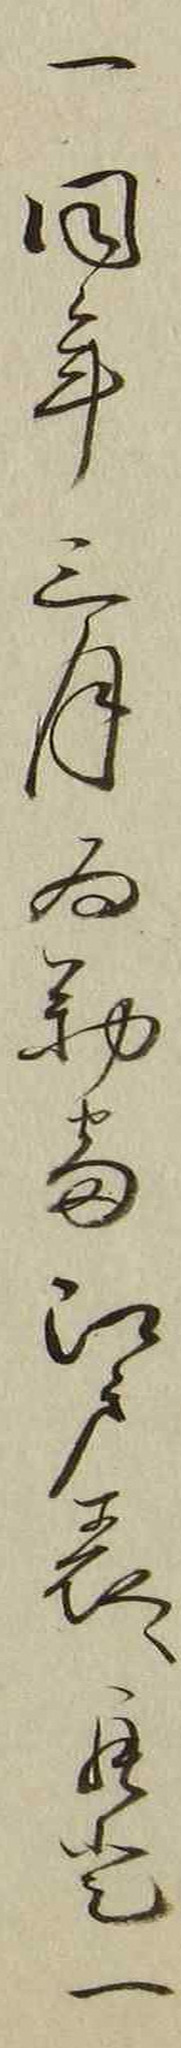一同年三月為勤番江戸表へ罷登一
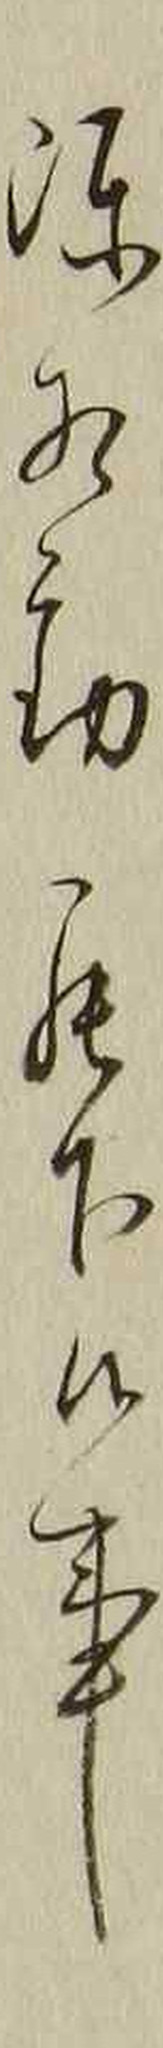陣相勤罷下候事
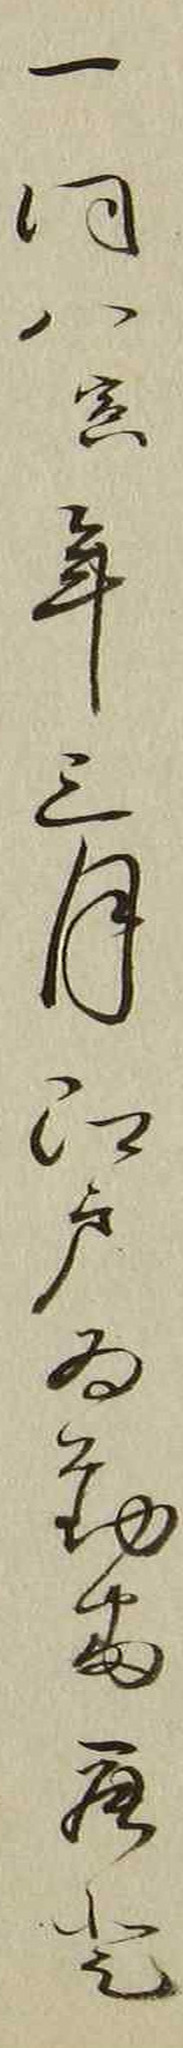一同八寅年三月江戸為勤番罷登
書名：諸士系譜　巻之2　い之部2
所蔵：会津若松市立会津図書館
